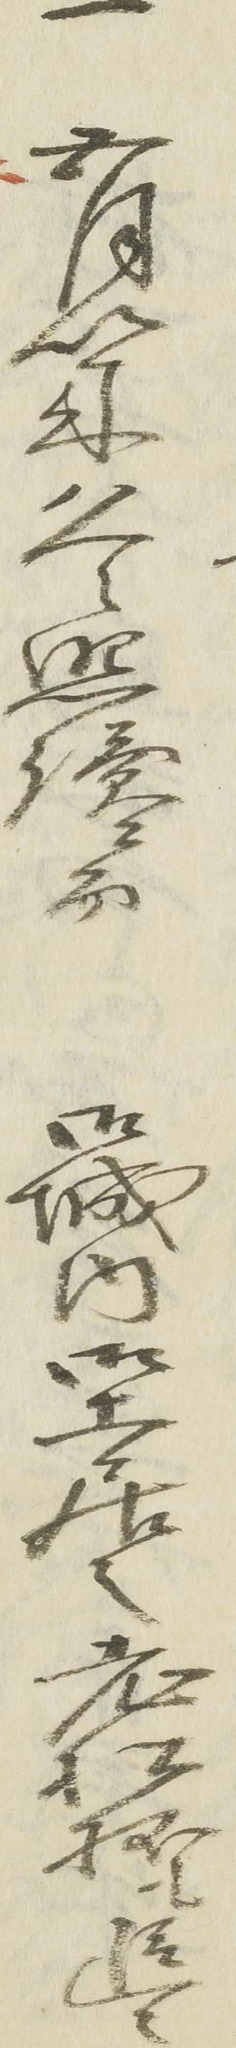一五月以来久〻照続ニ而御城内御土居之老松抔も追〻
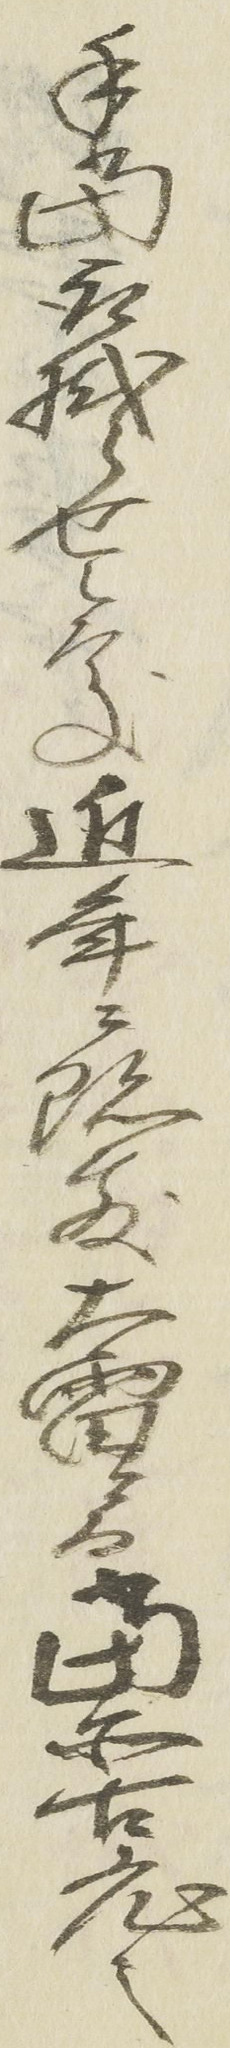手当取掛りせし処近年ニ珍敷大雷ニ而当所古老之
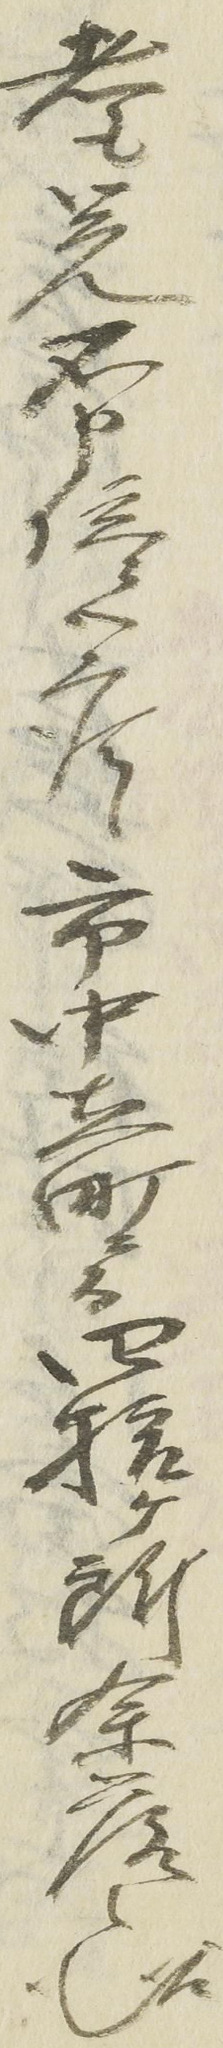者も覚不申位ニ御座候市中在町ニ而四拾ケ所余落候趣
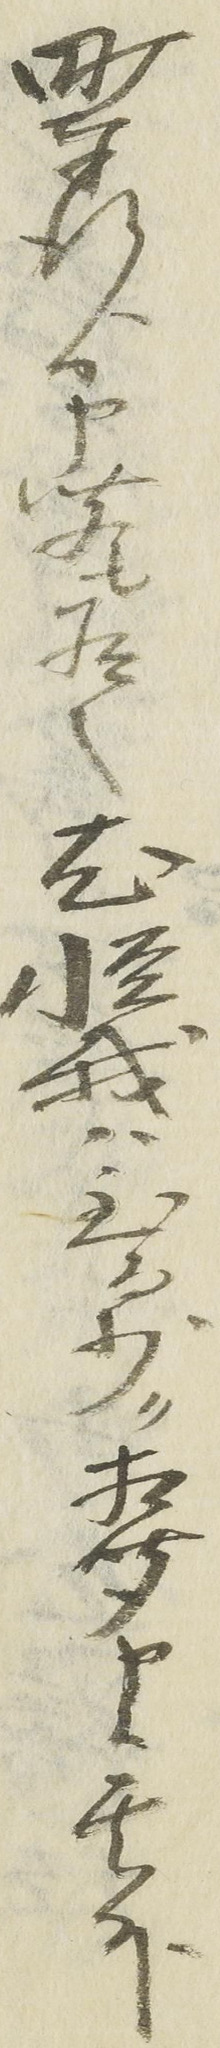町奉行ゟ申聞も有之尤怪我ハ至而少ク相聞申候其外
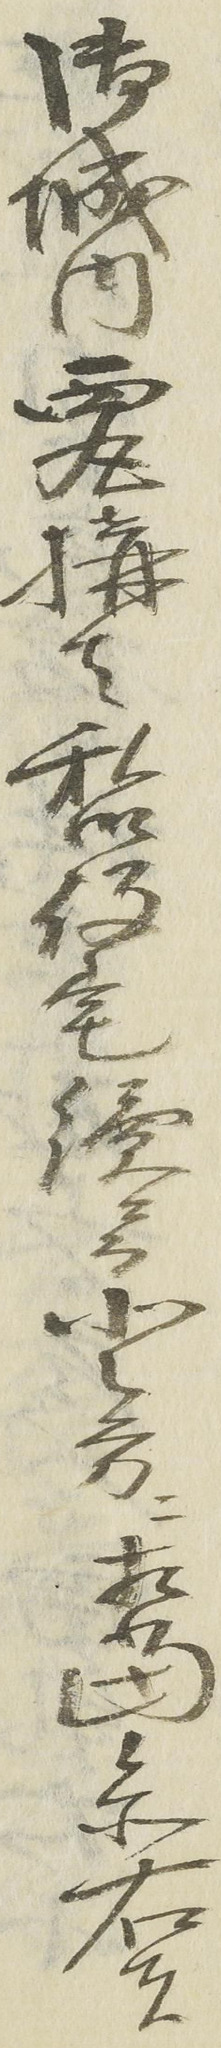御城内西丸構は私御役宅続ニ而北之方ニ相当候所右は
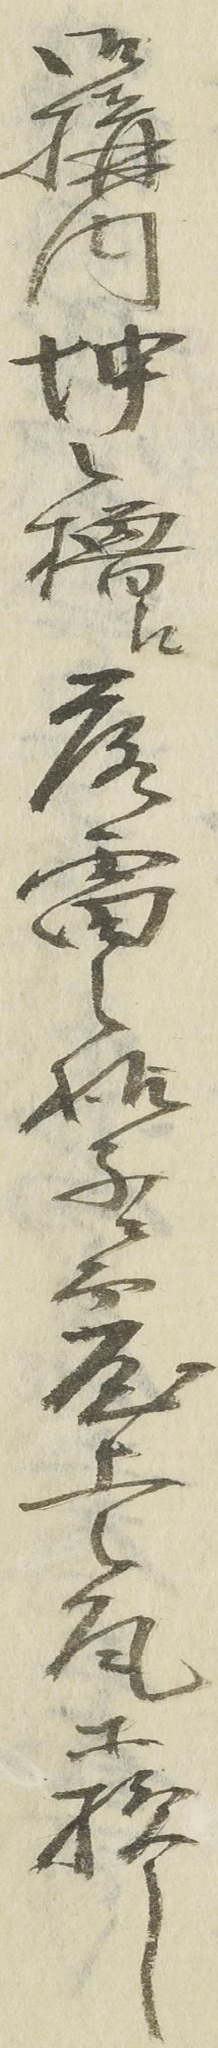御構内坤之櫓江落雷之様子ニ而屋上之瓦等損し

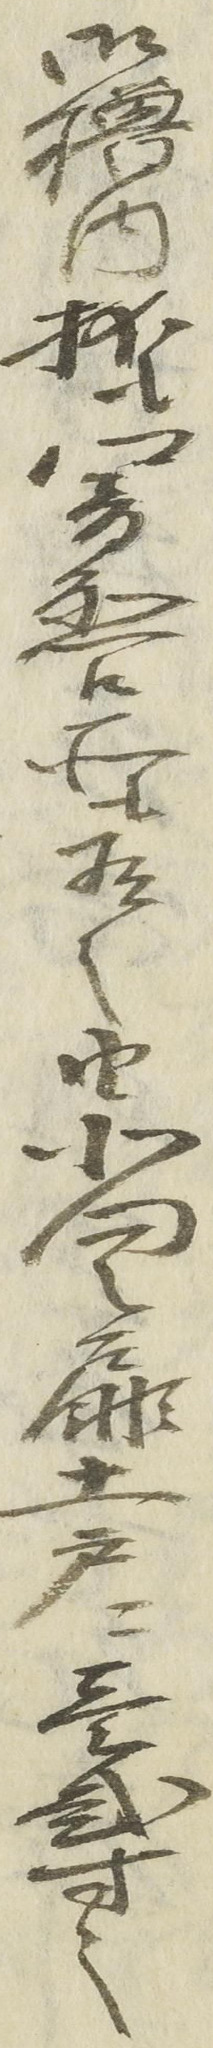御櫓内抔も響烈候所も有之由北向之扉土戸ニ壱弐寸之
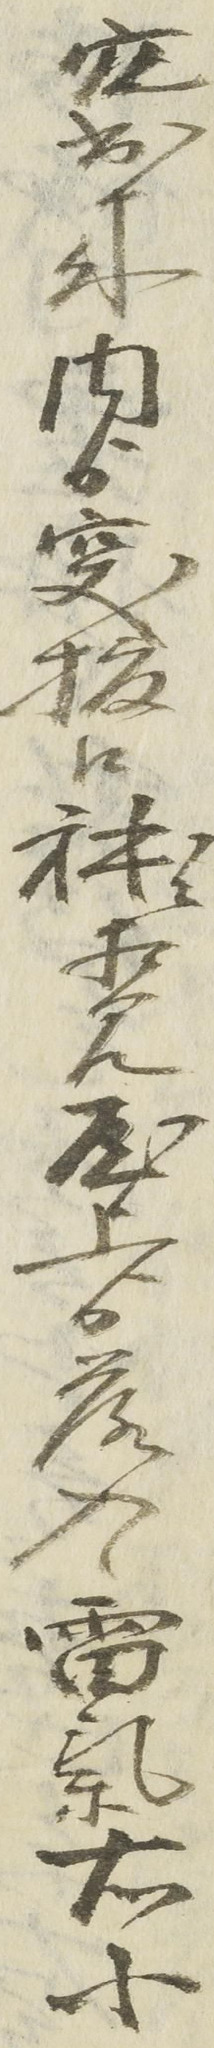穴出来内ゟ突抜候躰ニ相見屋上ゟ落入候雷気右小
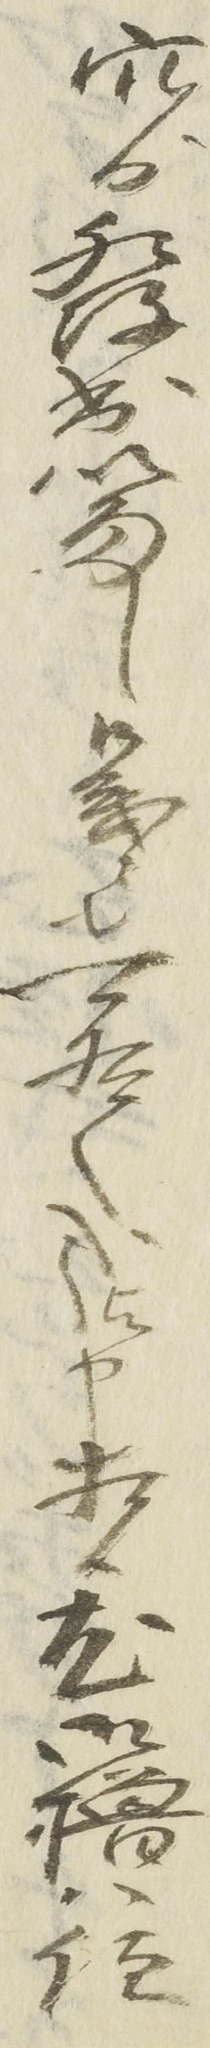穴ゟ発出いたし候義ニも可有之哉と申相候尤御櫓ハ住
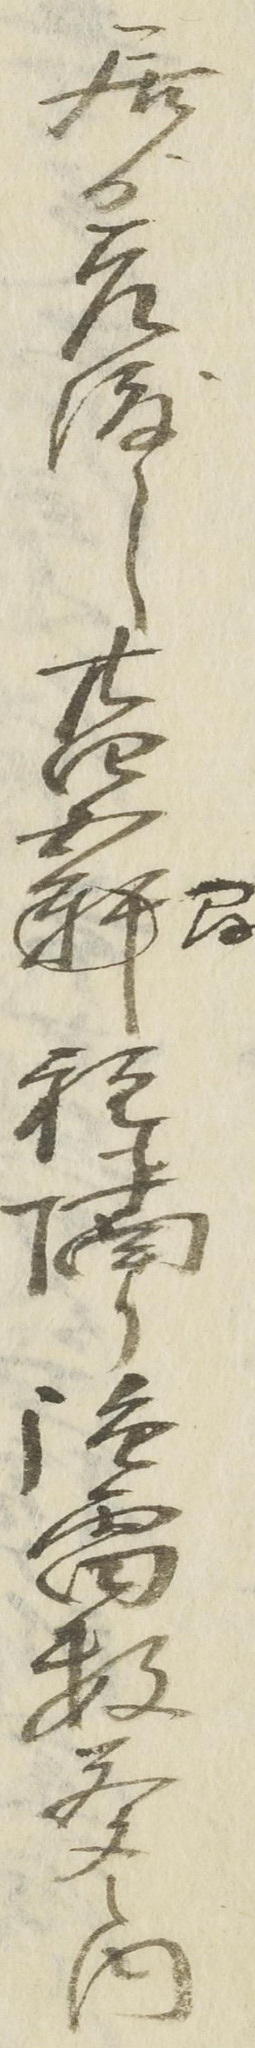居ゟ差渡し廿四五間程も隔り強雷数多之内
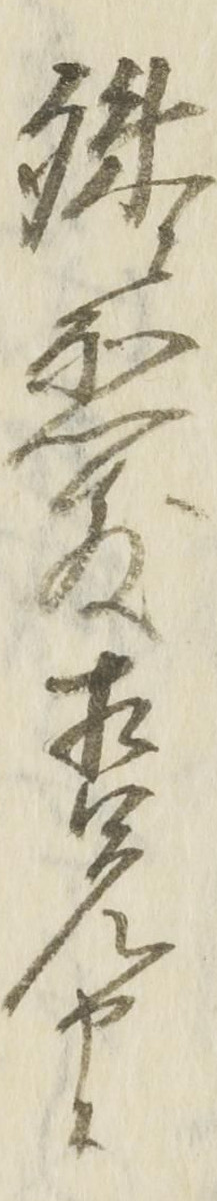殊ニ烈敷相見申候
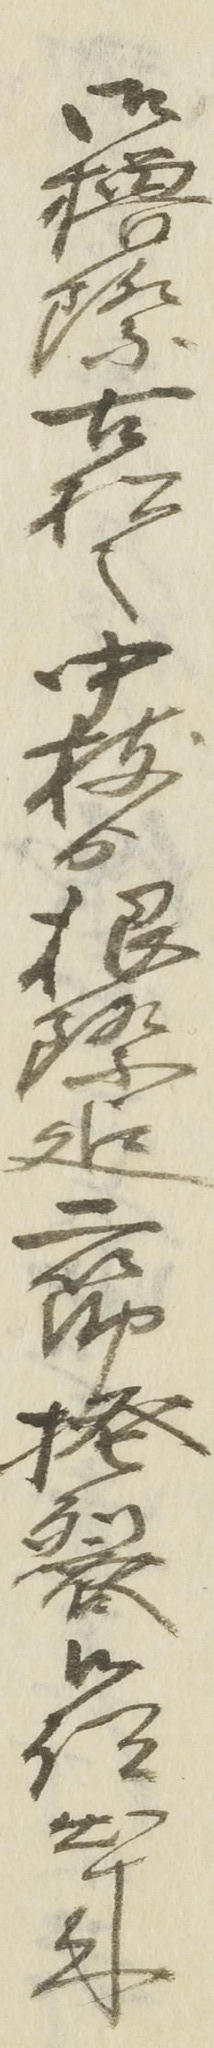一御櫓際古松之中枝ゟ根際迄二筋掻裂候位出来
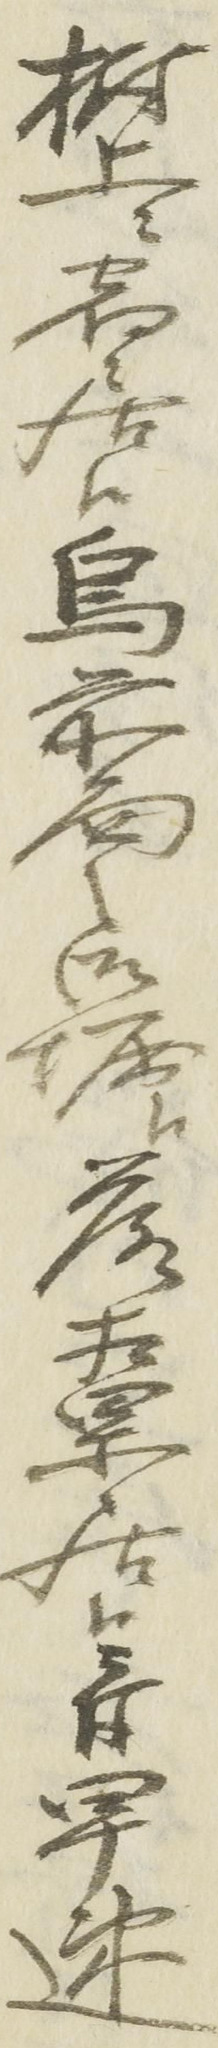樹上に宿居候烏前面之御堀江落相果居候ニ付早速
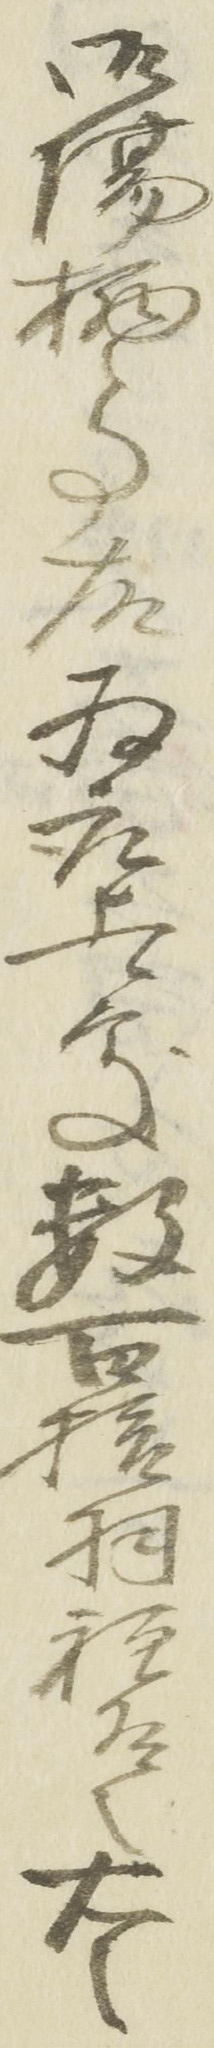御傷栖事故為取上候処数百拾羽程有之右之
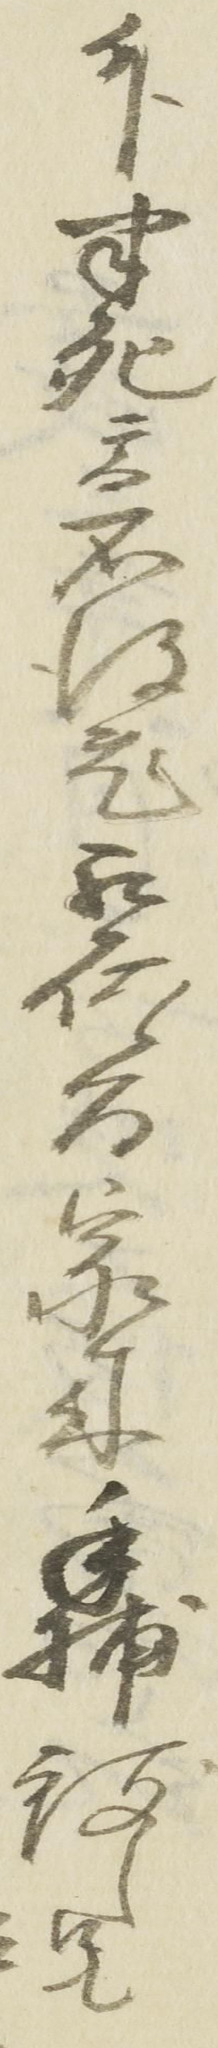外半死ニ而不得飛罷在候間家来手捕致し候も有之
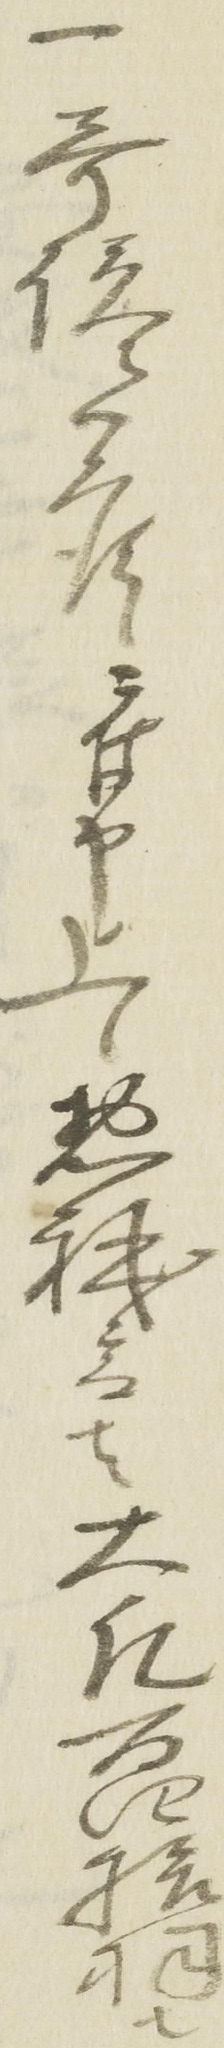一奇説ニ御座候ニ付申上候惣躰ニ而は大凡百四拾羽も
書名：安政乙卯江戸大地震筆記　安政丙辰八月大阪大雷雨之記追加　安政三辰年七月松前辺大地震并八月大風雨記録
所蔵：東京大学地震研究所図書室 Earthquake Research Institute Library, The University of Tokyo, JAPAN
